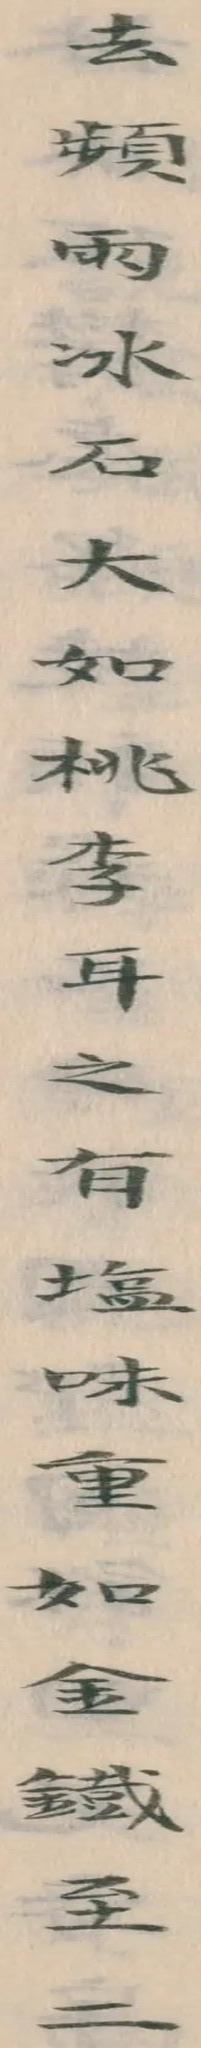去頻雨冰石大如桃李耳之有塩味重如金鐵至二
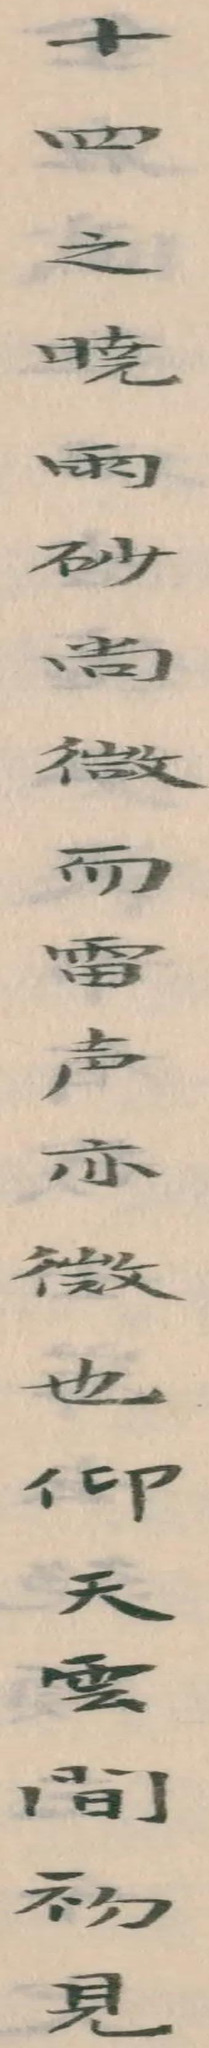十四之暁雨砂尚微而雷声亦微也仰天雲間初見
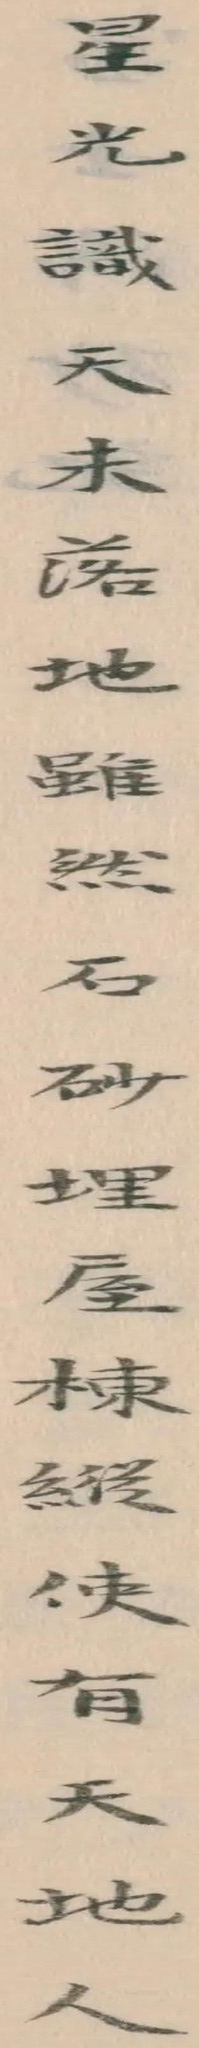星光識天未落地雖然石砂埋屋棟縦使有天地人
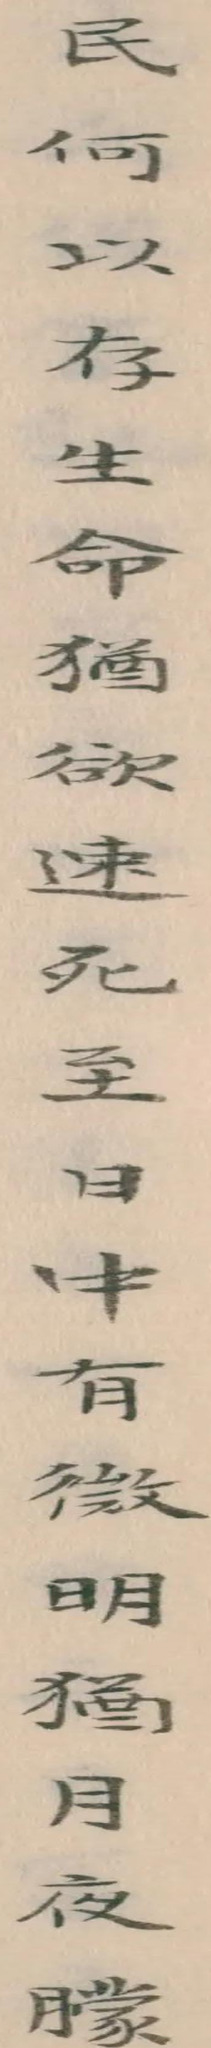民何以存生命猶欲速死至日中有微明猶月夜朦
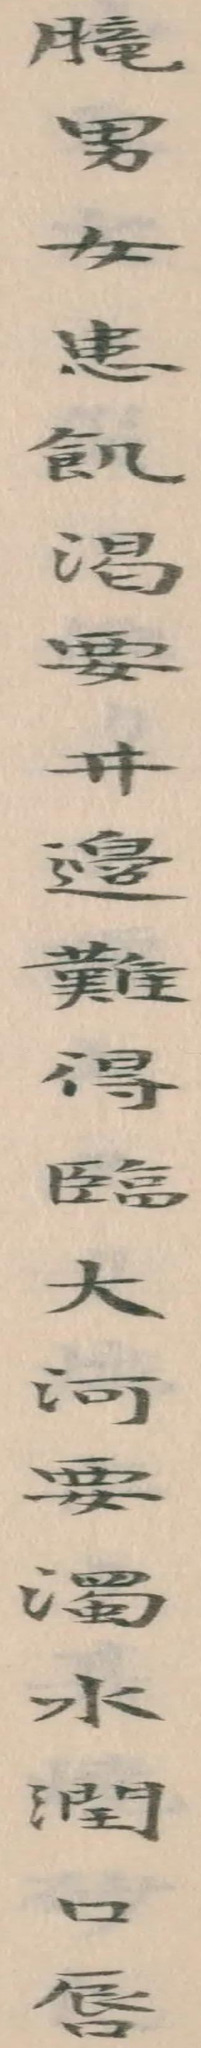男女患飢渇要井邉難得臨大河要濁水潤口唇
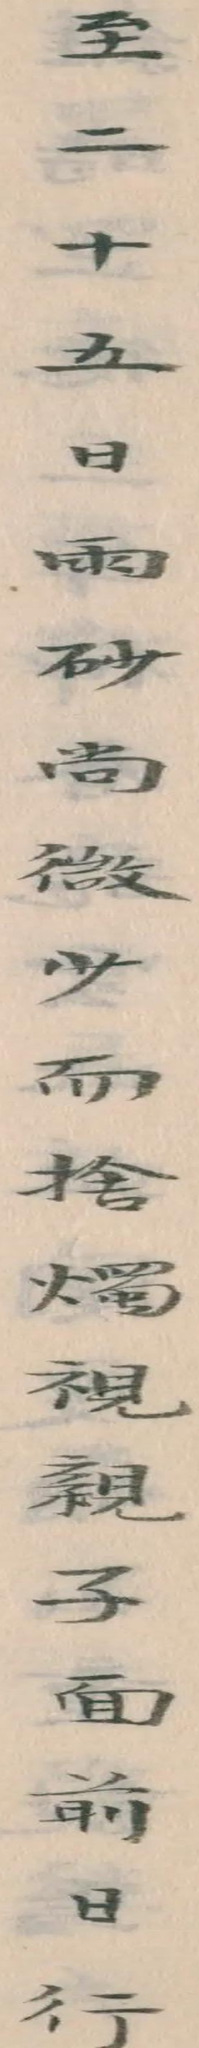至二十五日雨砂尚微少而捨燭視親子面前日行
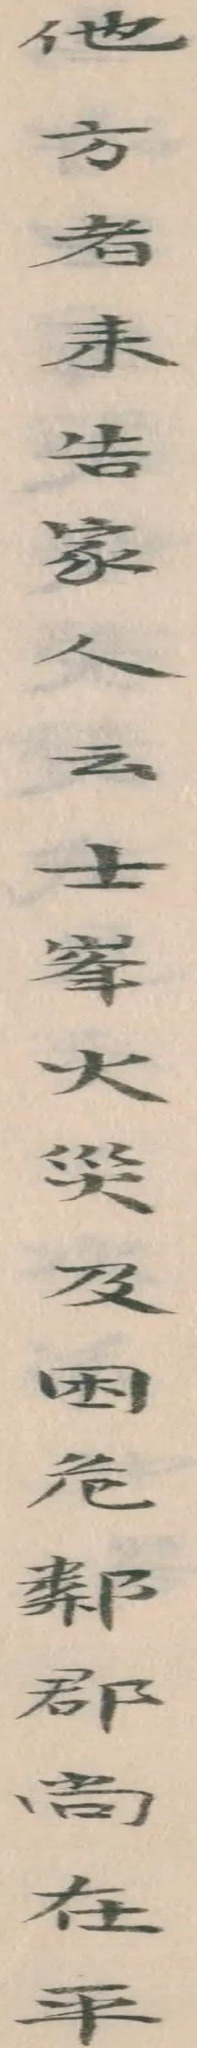他方者来告家人云士峯火災及困危鄰郡尚在平
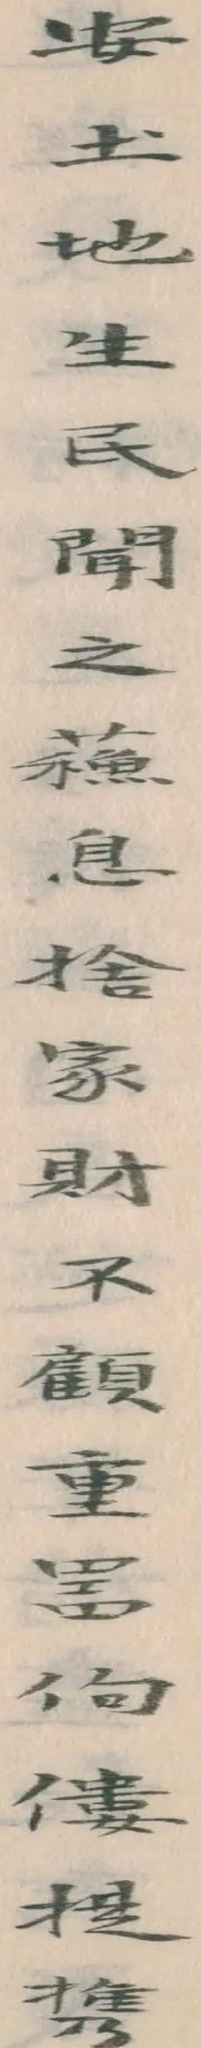安土地生民聞之蘓息捨家財不顧重噐佝僂提携
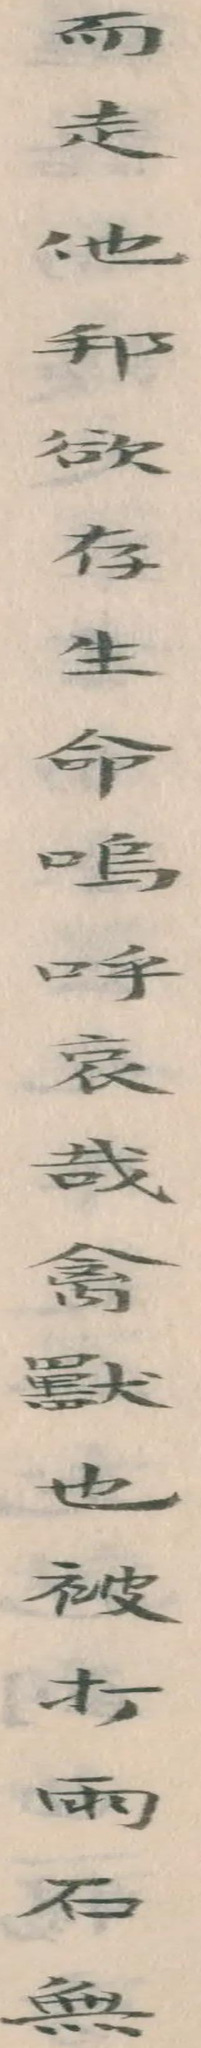而走他邦欲存生命嗚呼哀哉禽獸也被打雨石無
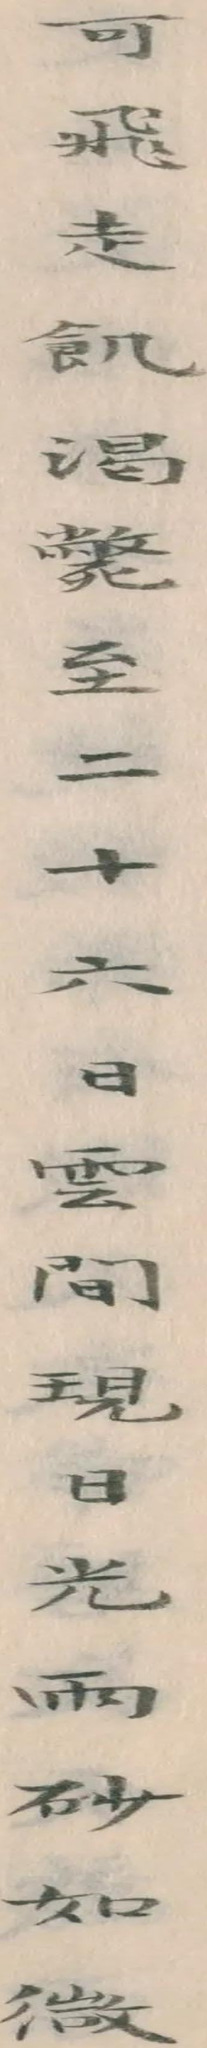可飛走飢渇斃至二十六日雲間現日光雨砂如微
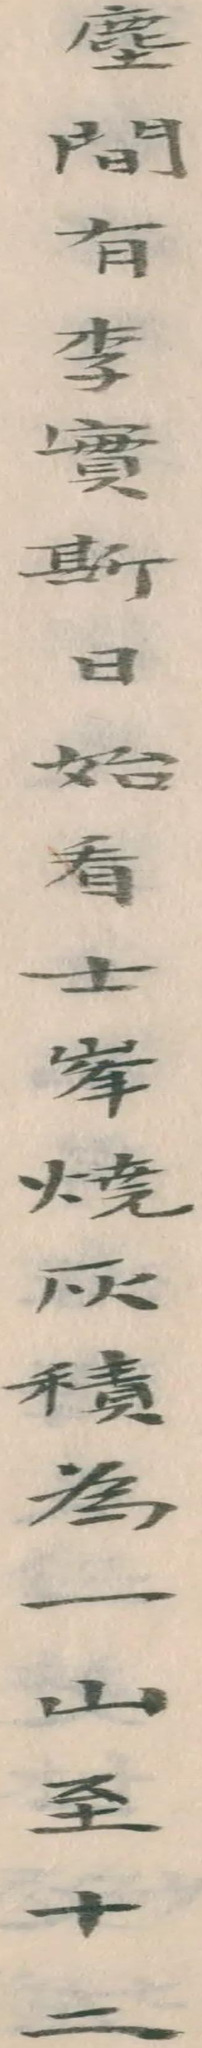塵間有李實斯日始看士峯焼灰積為一山至十二
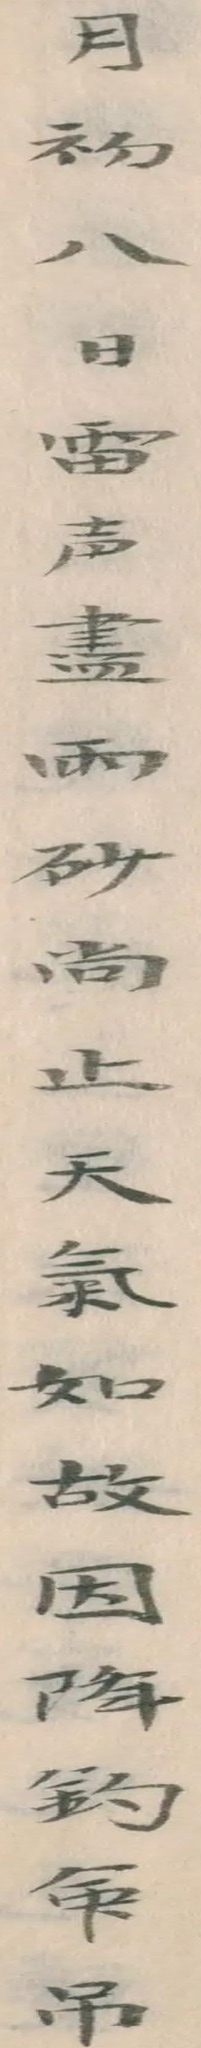月初八日雷声盡雨砂尚止天氣如故因降釣㑒吊
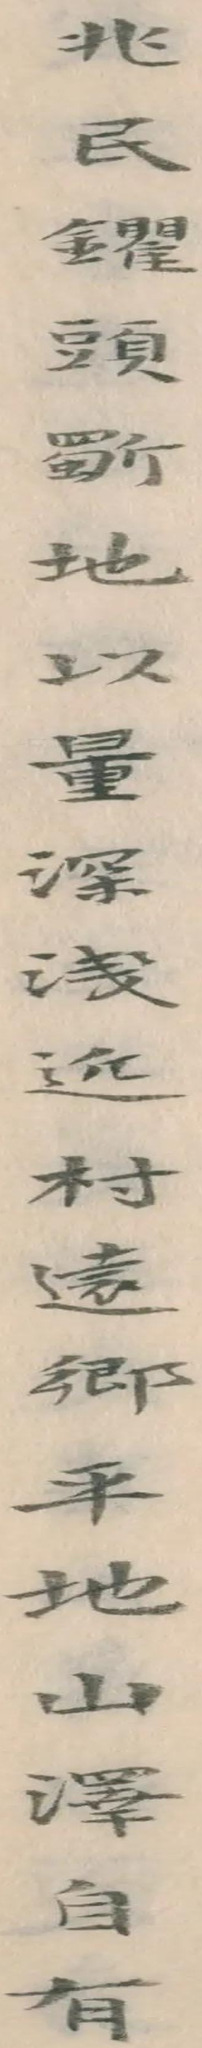兆民鑺頭地以量深浅近村遠郷平地山澤自有

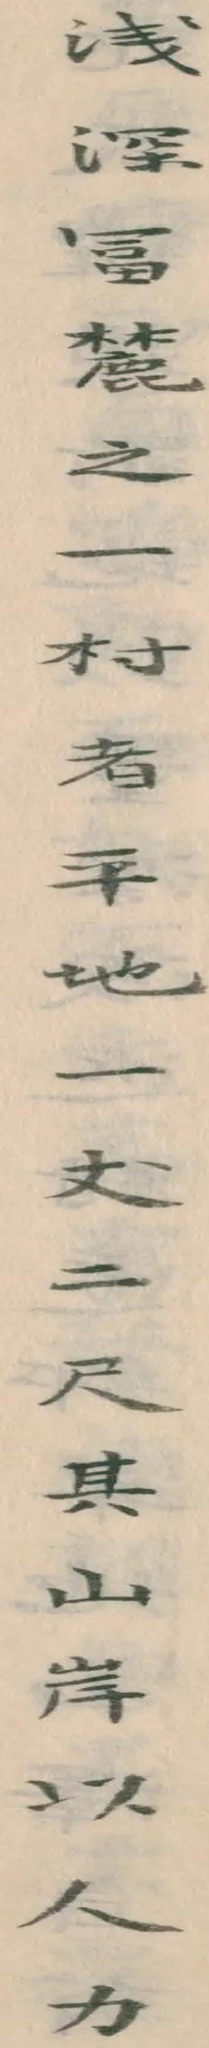浅深冨麓之一村者平地一丈二尺其山岸以人力
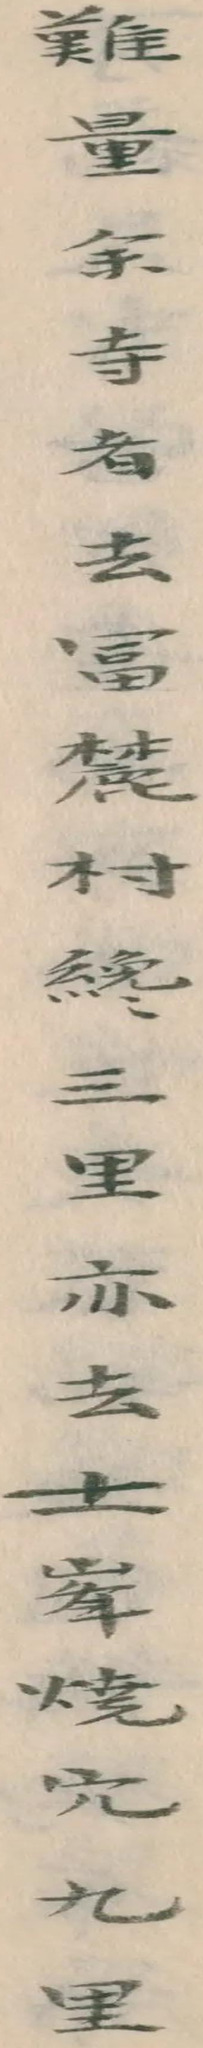難量余寺者去冨麓村纔三里亦去士峯焼穴九里
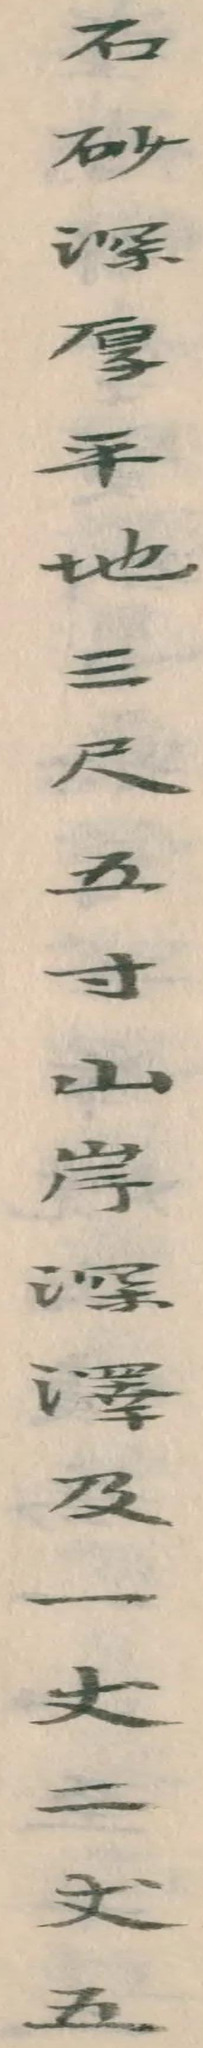石砂深厚平地三尺五寸山岸深澤及一丈二丈五
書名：地災撮要. 巻11-12(地震之部)
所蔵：国立国会図書館 National Diet Library, JAPAN
